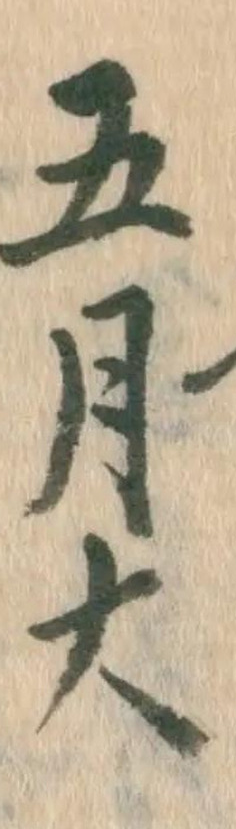五月大
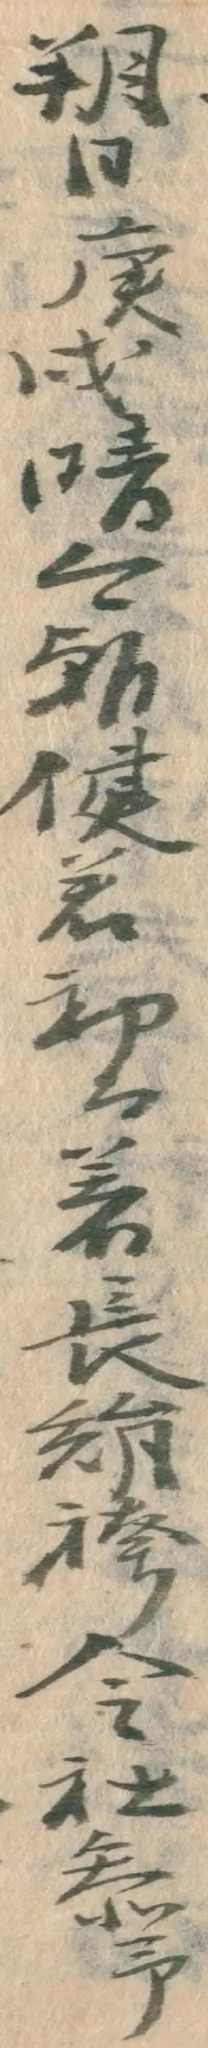朔日庚戌晴、今朝健若初而着長絹袴、令社参、予
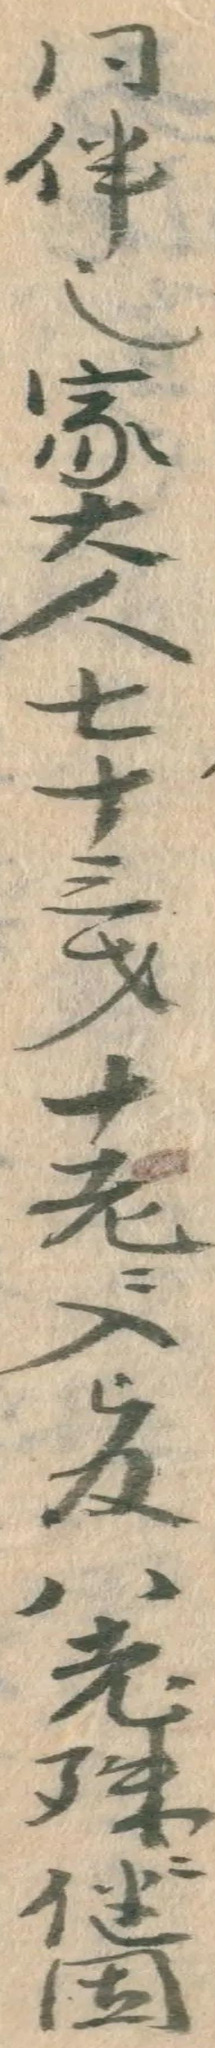同伴也、家大人七十三才、十老ニ入被及八老殊ニ健固、
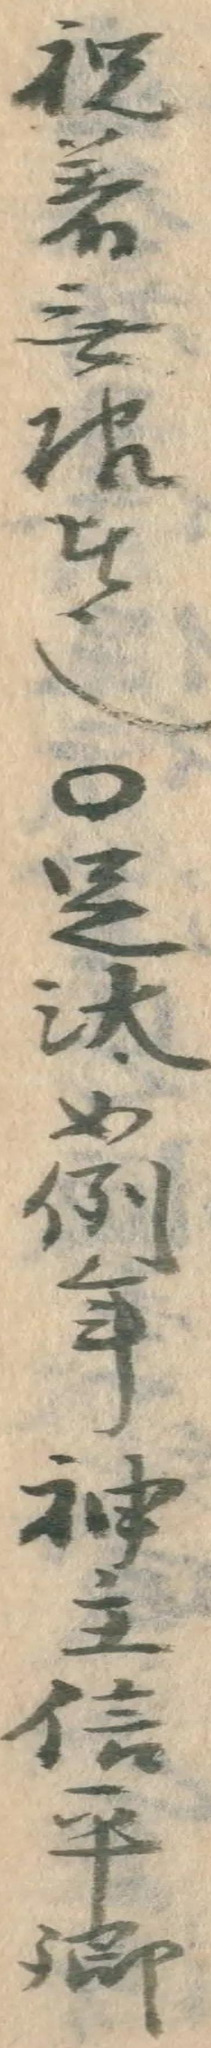祝着無限奉也、○足汰如例年、神主信平卿

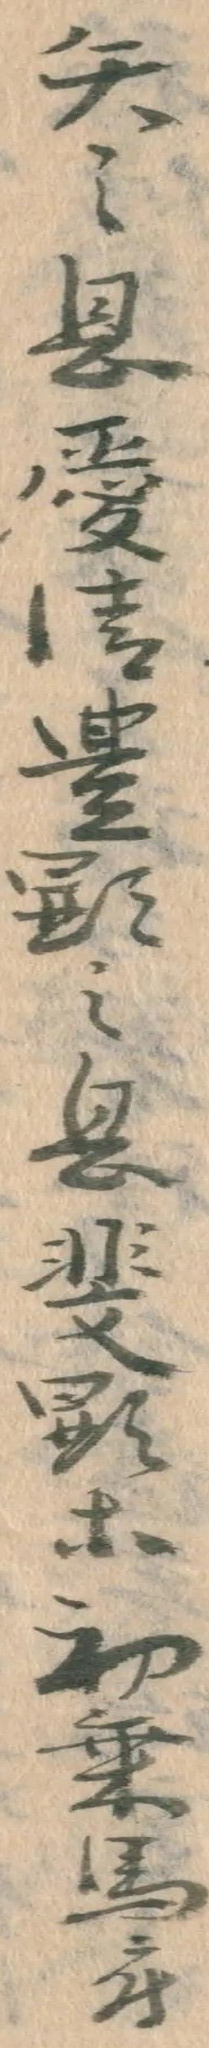矢之息愛清・豊顕之息斐顕等初乗馬ニ付
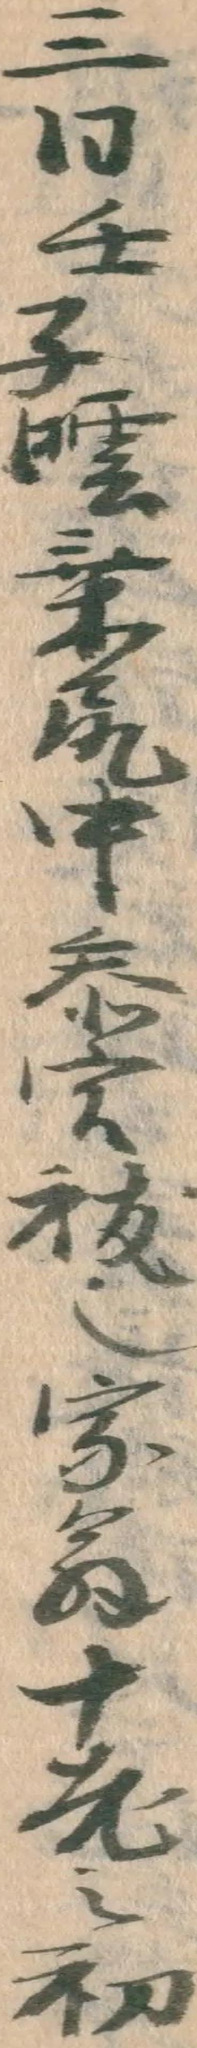三日壬子曇、乗尻中参宮祓也、家翁十老之初
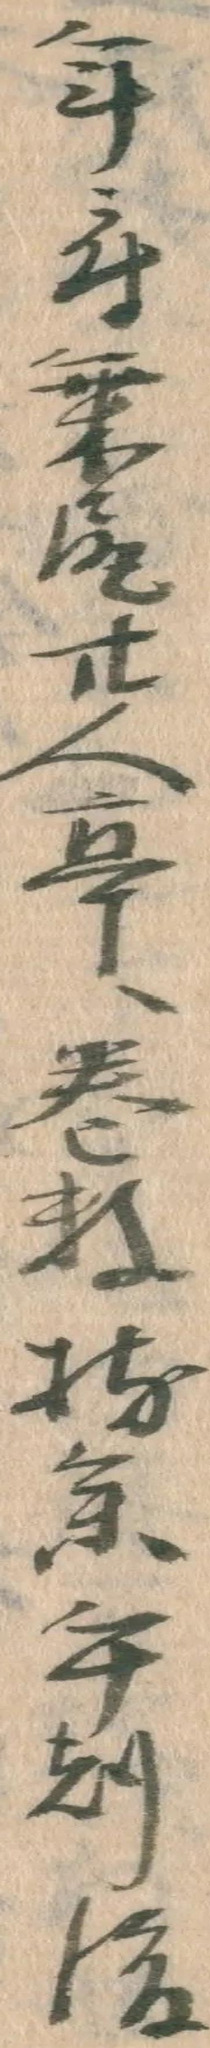年ニ付、乗尻廿人亭へ巻数持参、午刻後
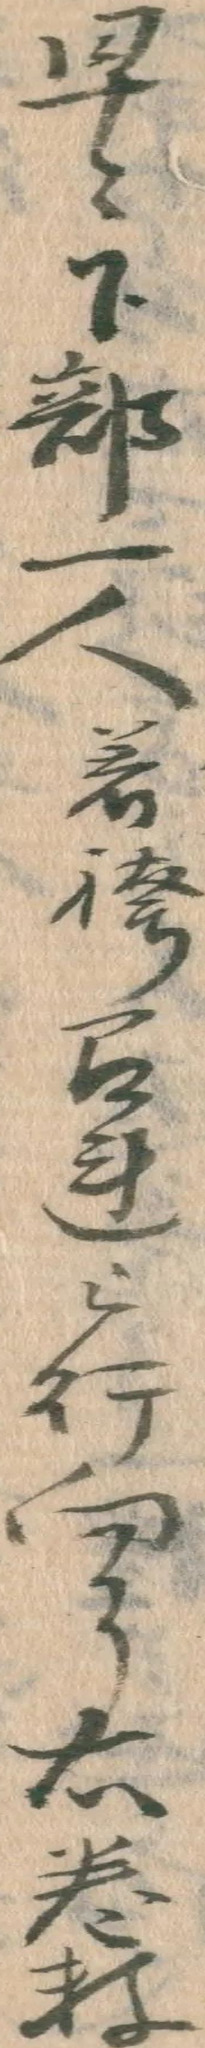早〻下部一人着袴召連被行向了、右巻数
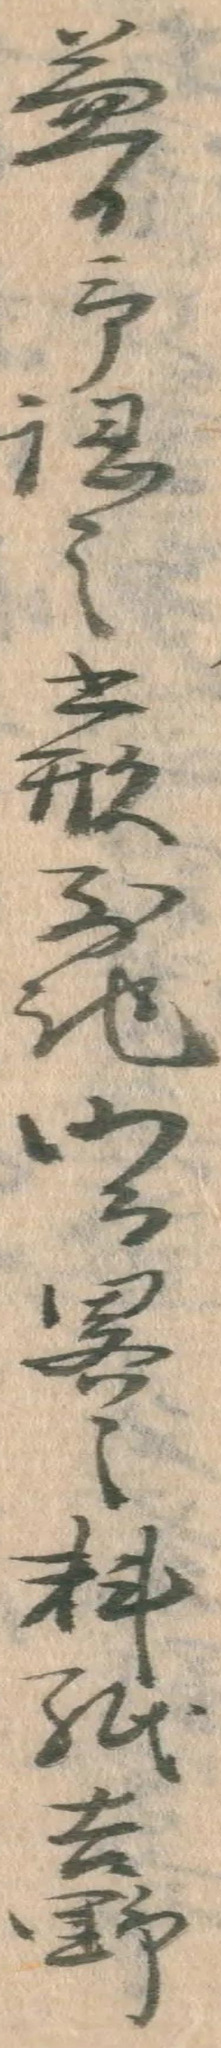兼而予認之、書形別記、仍而略之、科紙吉野
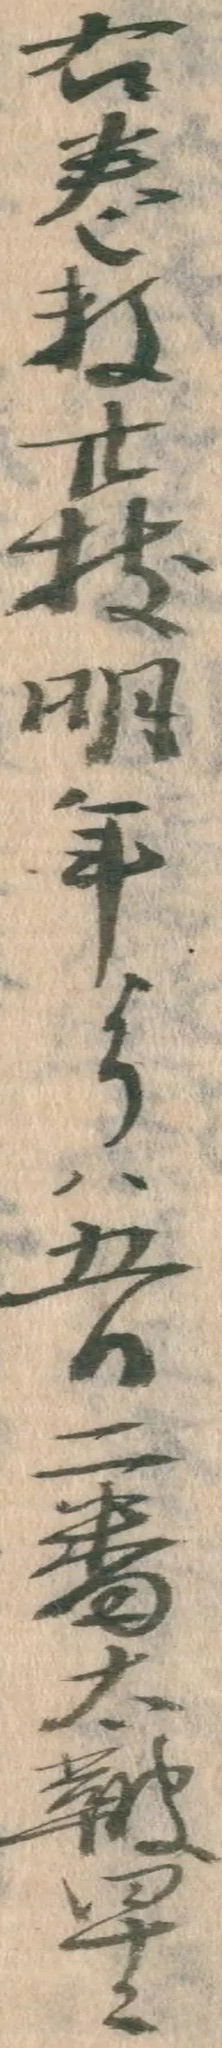右巻数廿枝、明年よりハ五日二番太鼓、早々
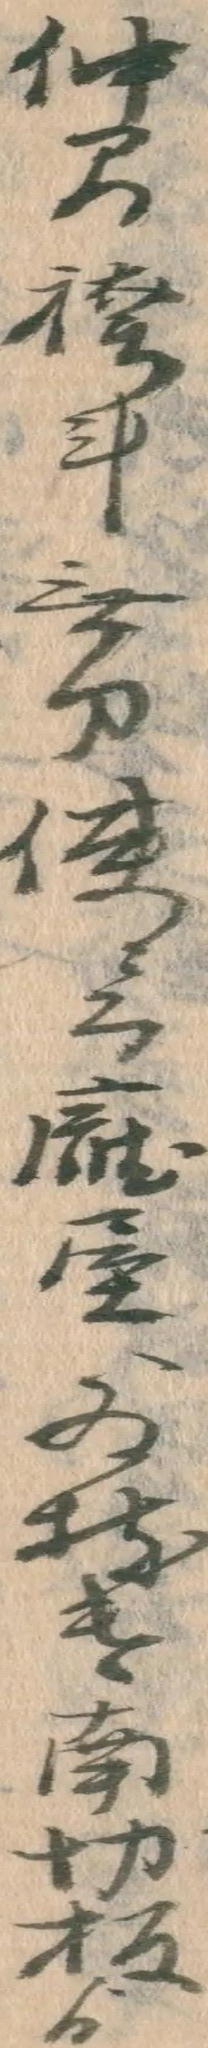仲間袴斗無刀使ニ而、廳屋へ為持遣、南切板ゟ
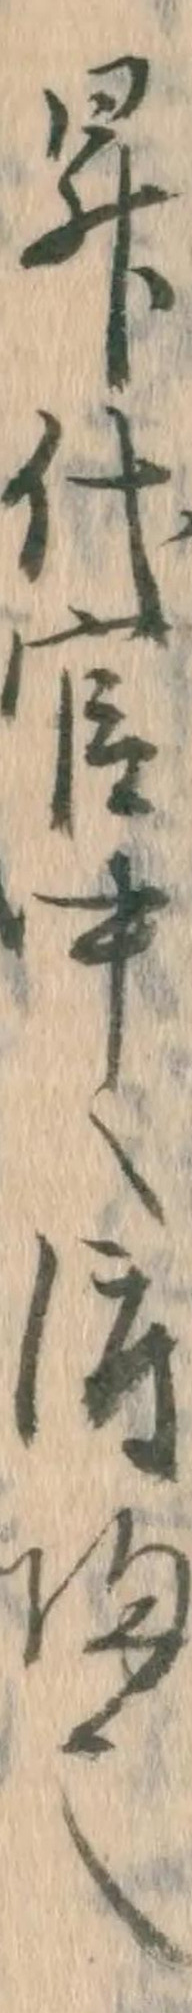昇代官中へ渡帰之、
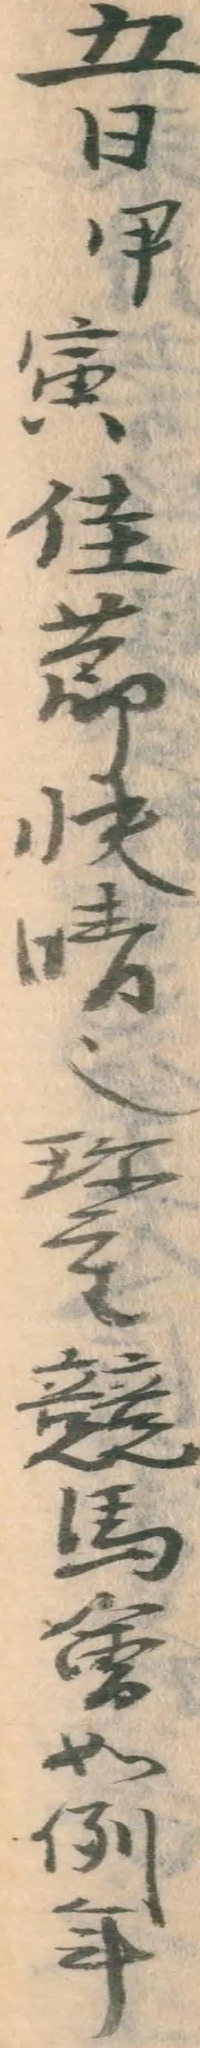五日甲寅佳節快晴也、珍重、競馬會如例年、
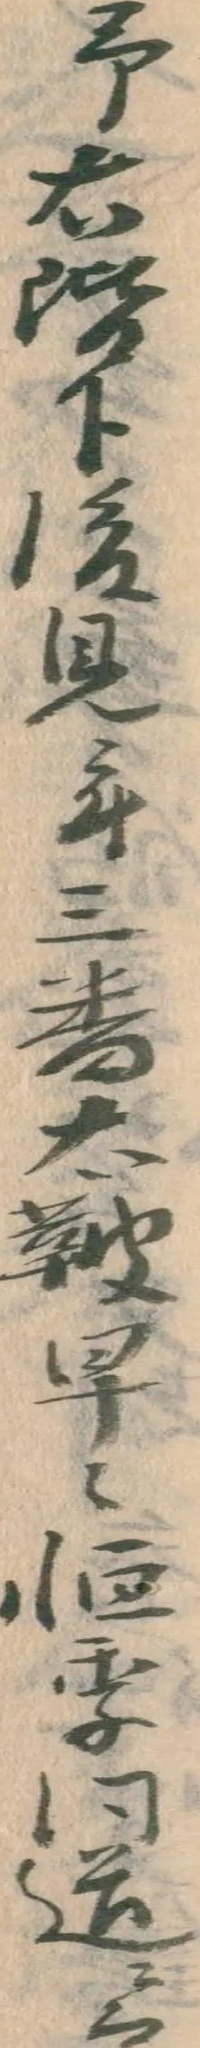予右階下後見ニ付、三番太鼓早〻恒季同道ニ而
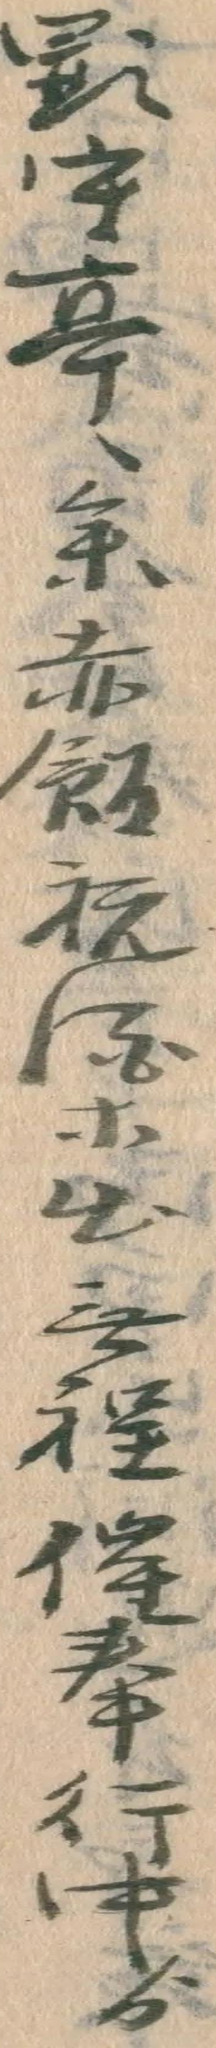顕守亭へ参、赤飯祝儀等出、無程催奉行中ゟ
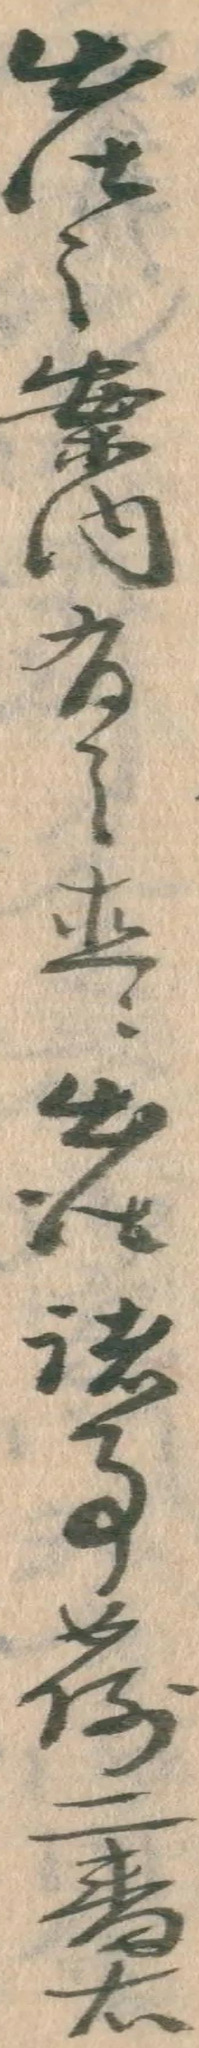出仕之案内有之、直ニ出仕、諸事如例、二番右
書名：賀茂社記録. 第63冊
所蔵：国立国会図書館 National Diet Library, JAPAN
